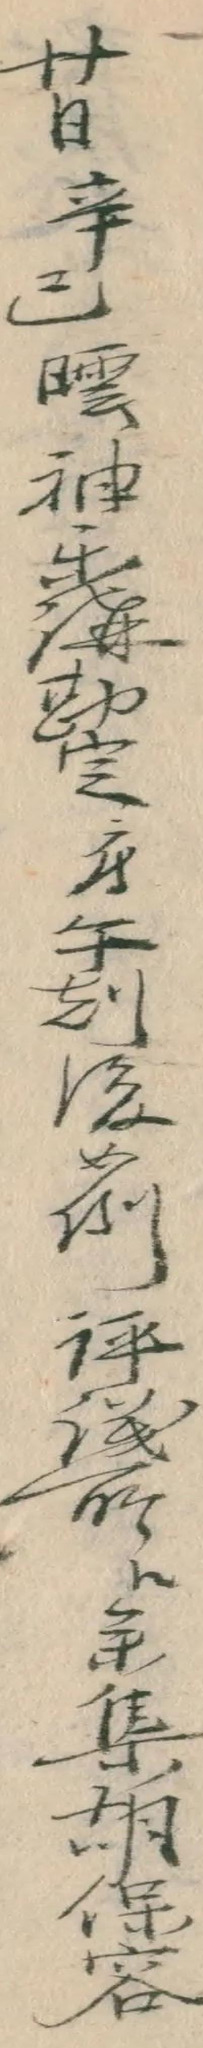廿日辛巳曇神楽講勘定ニ付午刻後如例評議所え参集胡保容
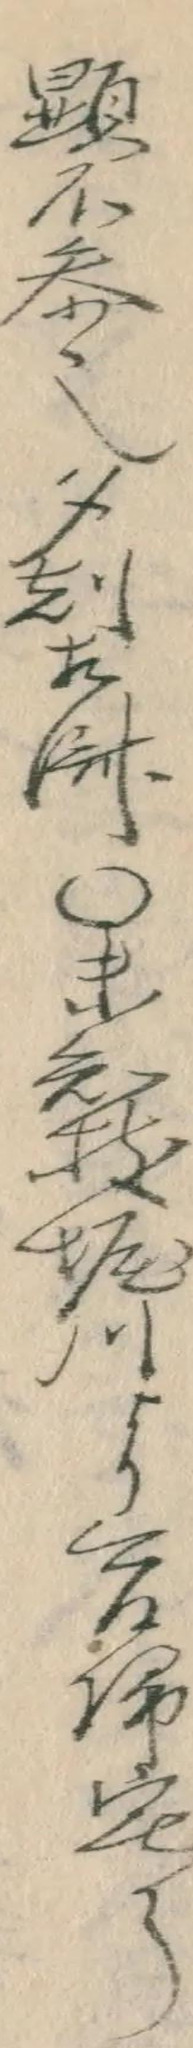顕不参也夕刻相済〇未知技堀川より今日帰宅了
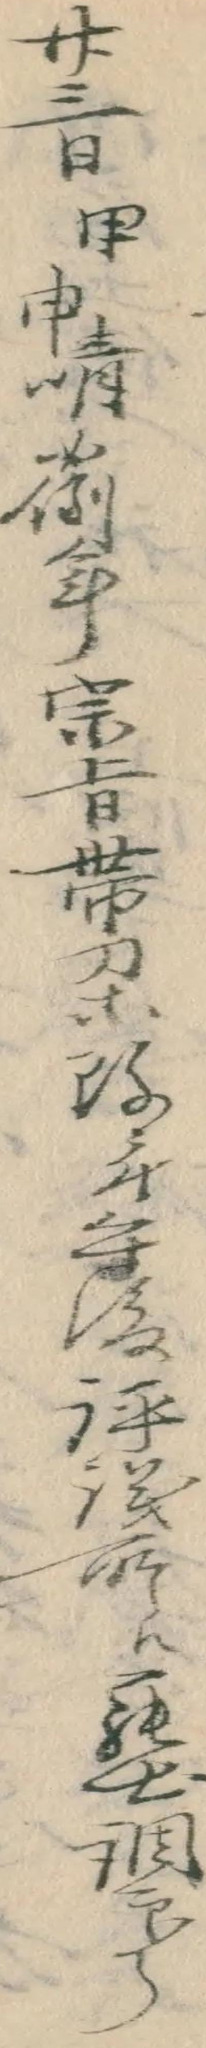廿三日甲申晴如例年宗旨帯刀等改ニ付午後評議所え罷出調印了
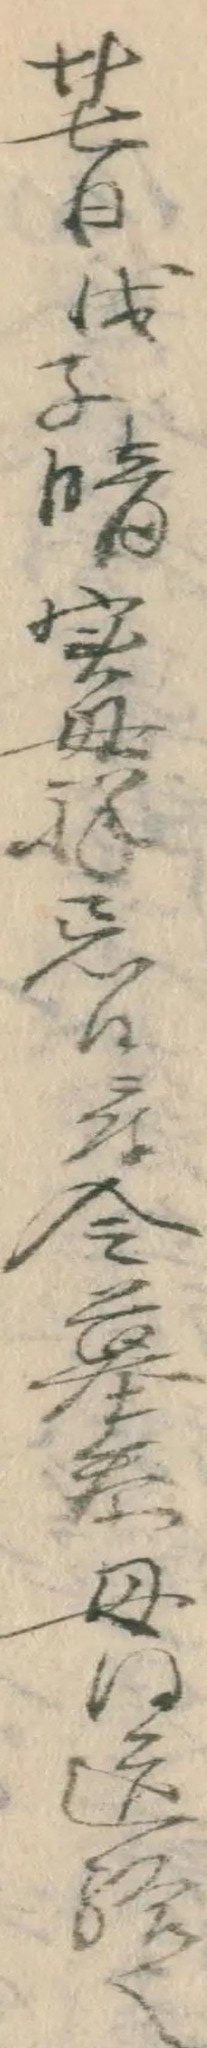廿七日戊子晴実母祥忌日ニ而令墓参母同道路也
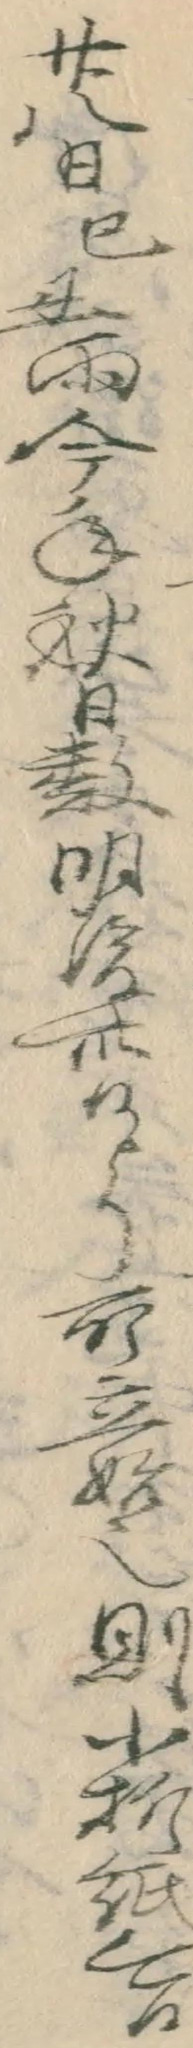廿八日己丑雨今年秋日数明後卅九日より所立始也則小折紙今日
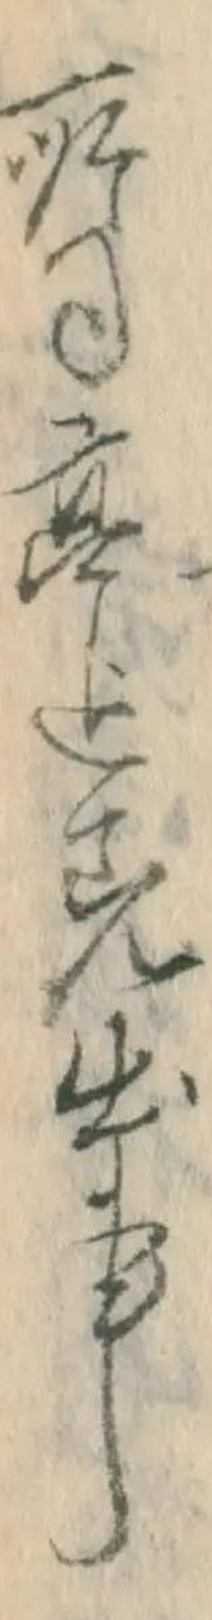所司亭迄差出事

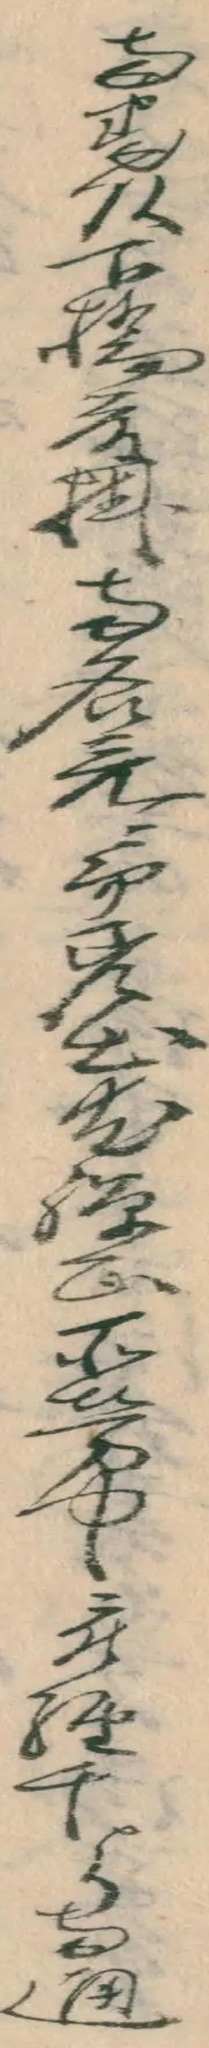両番頭下橋藤掛南各充ニ而差出尤弾正所労中ニ付経千より寺通
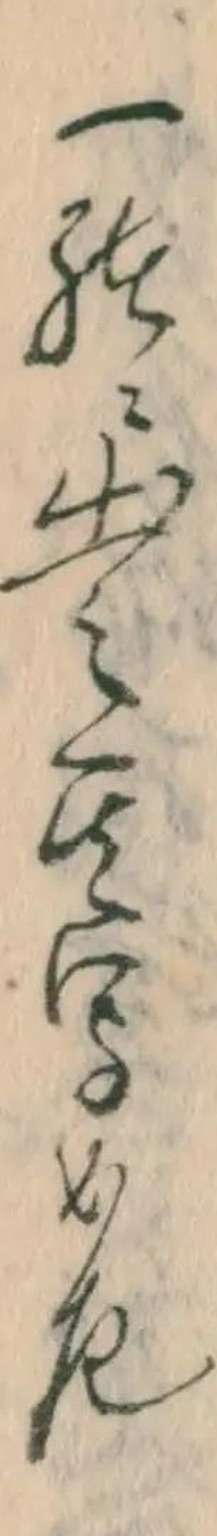一躰ニ出之其写如左
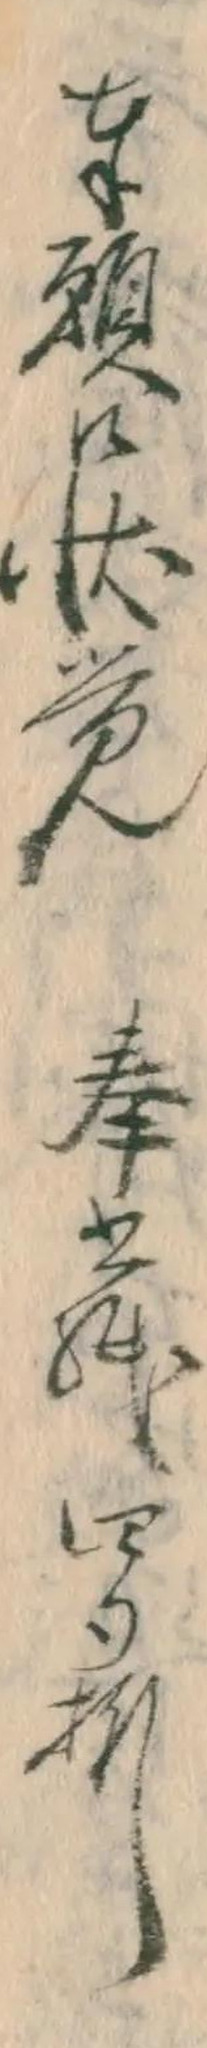奉願口伏覚奉書紙四ツ折
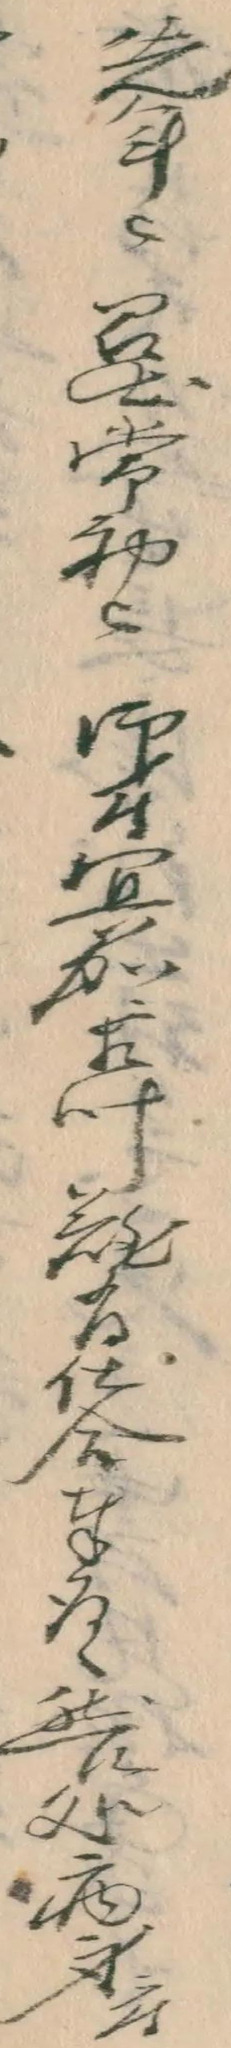先年被召出常勤被仰付冥加ニ相叶難有仕合奉存候然ル処病身ニ付
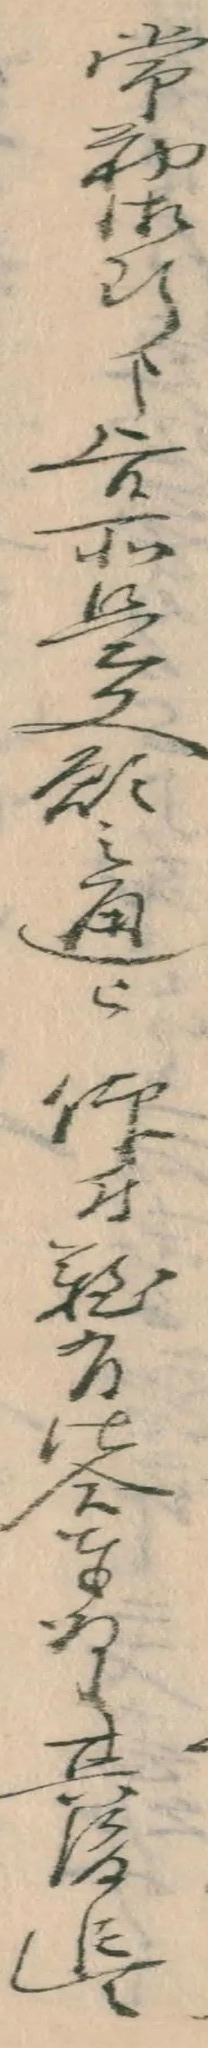常勤御断申上候所是又願之通被仰付難有仕合奉存候其後追々
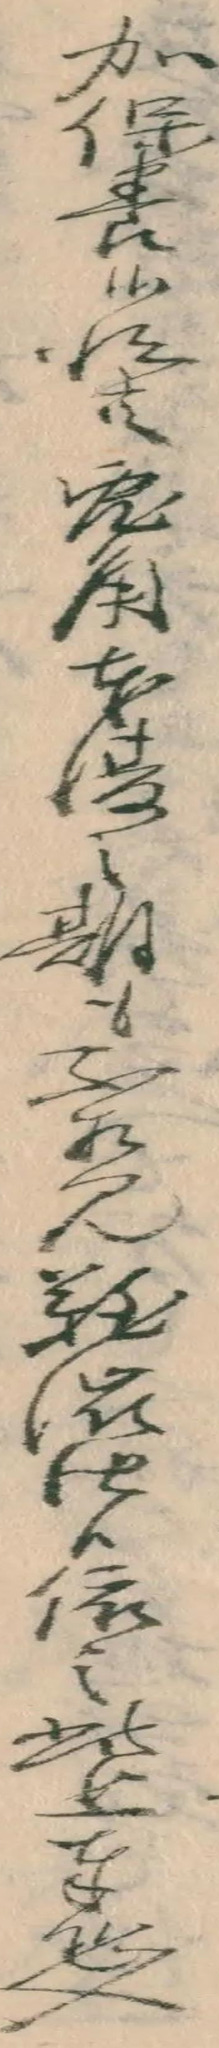加保養候得共兎角本復之期も不相見難渋仕候依之此上奉恐入
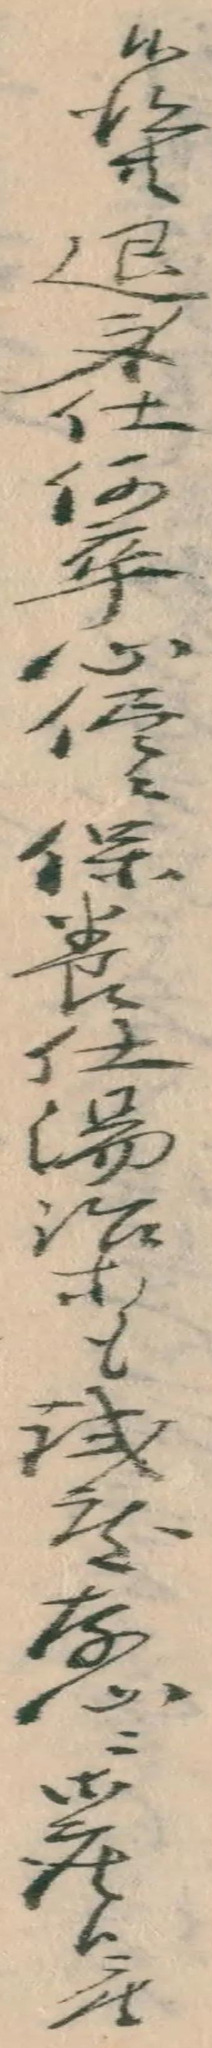候得共退身仕何卒心侭ニ保養仕湯治等も試度存心に御座候ニ付
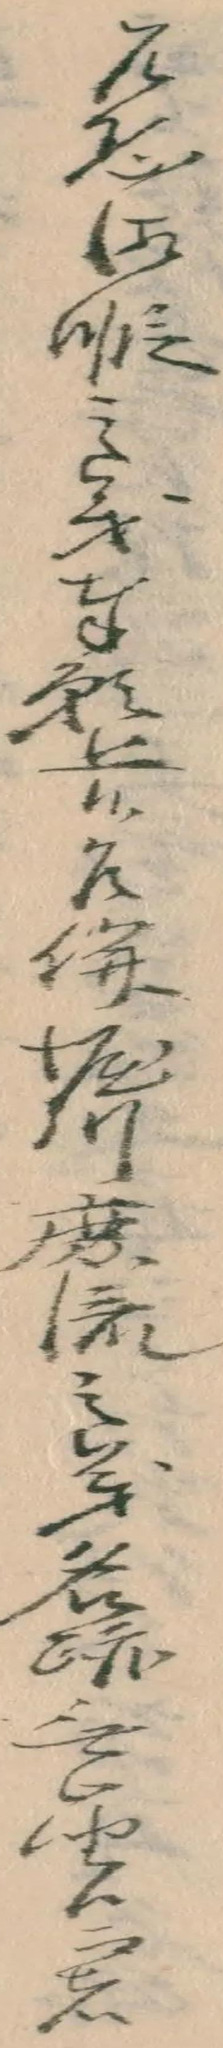乍恐御暇之義奉願上候乍併堀川庶流之義名跡無御座候而者
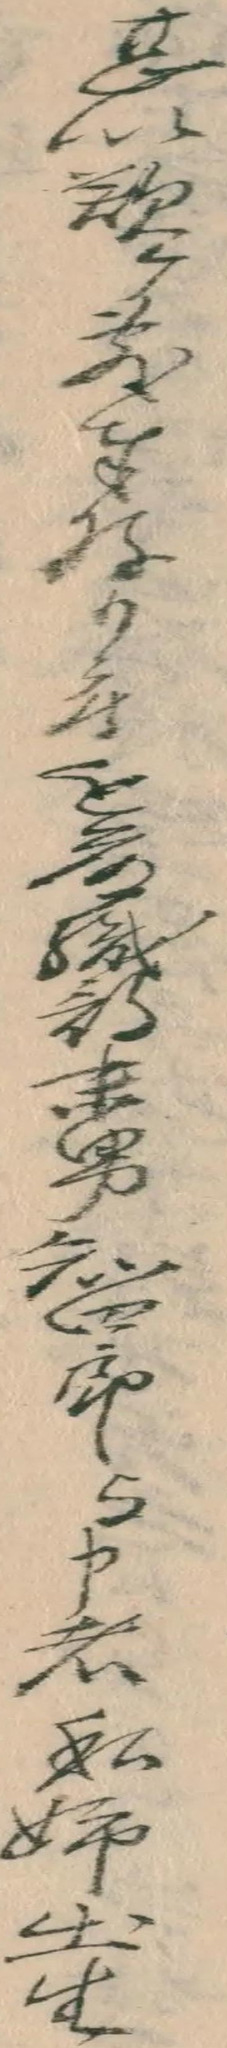甚以歎ヶ敷奉存候ニ付近藤織部末男知四郎と申者私姉出生
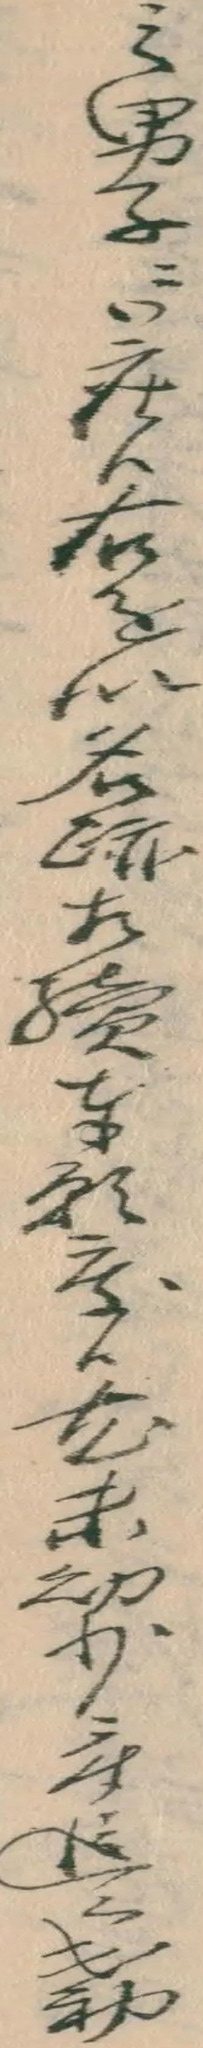之男子ニ御座候右を以名跡相續奉願度候尤未幼少ニ付追而出勤
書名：賀茂社記録. 第65冊
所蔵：国立国会図書館 National Diet Library, JAPAN
